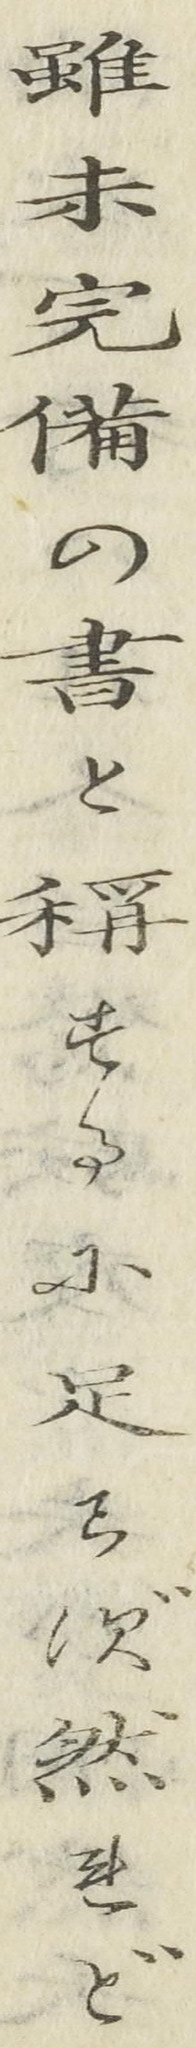雖未完備の書と称するに足らじ然れど
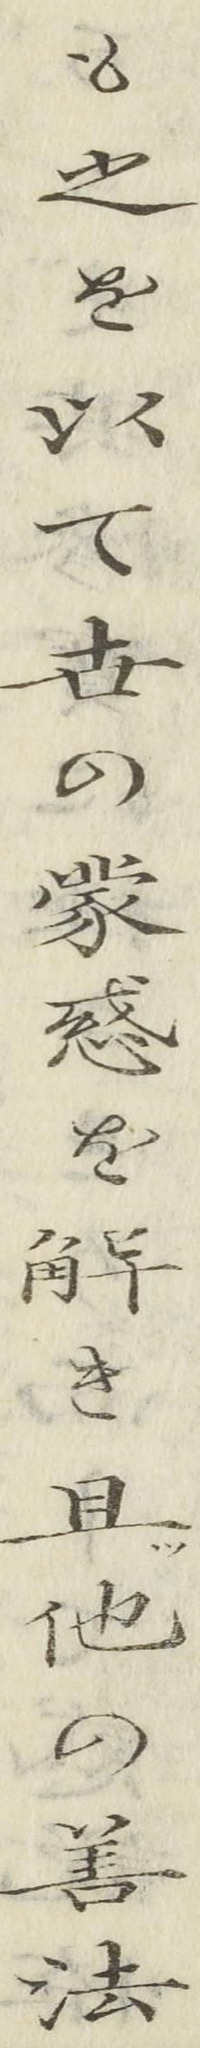も之を以て世の蒙惑を解き且他の善法
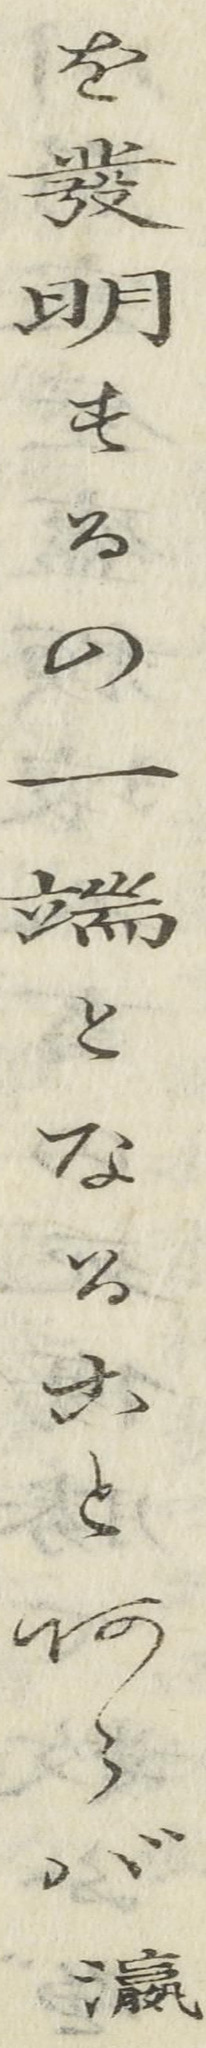を発明するの一端となることあらば瀛
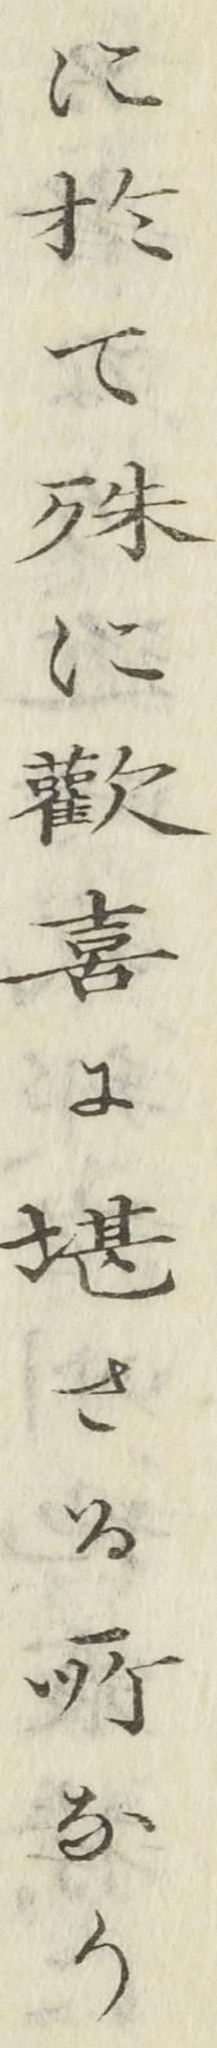に於て殊に歓喜に堪さる所なり
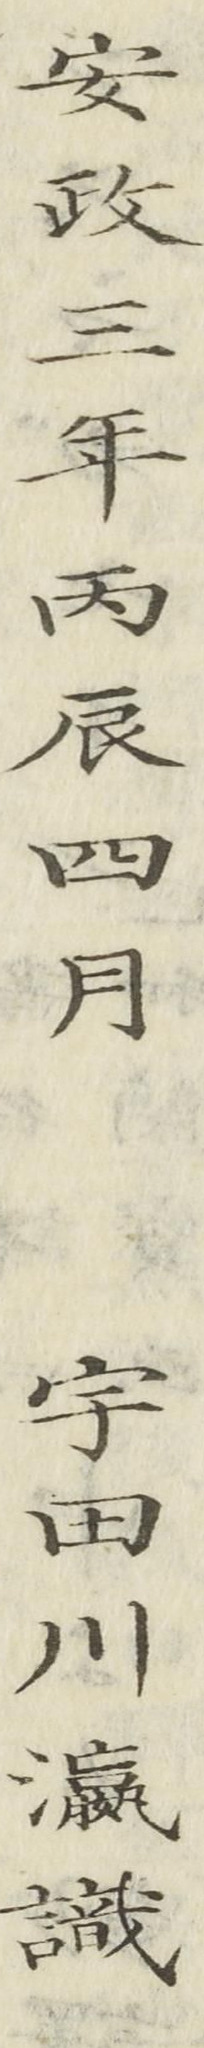安政三年丙辰四月宇田川瀛識
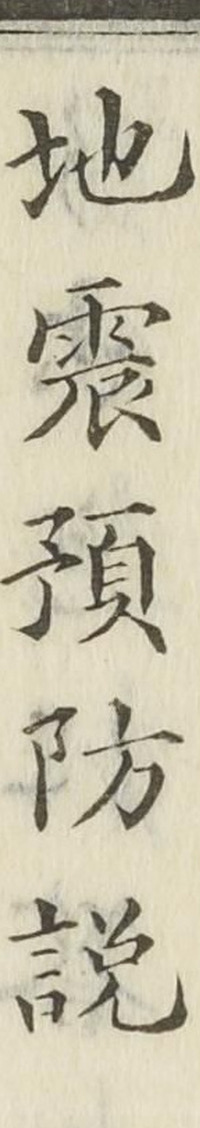地震預防説
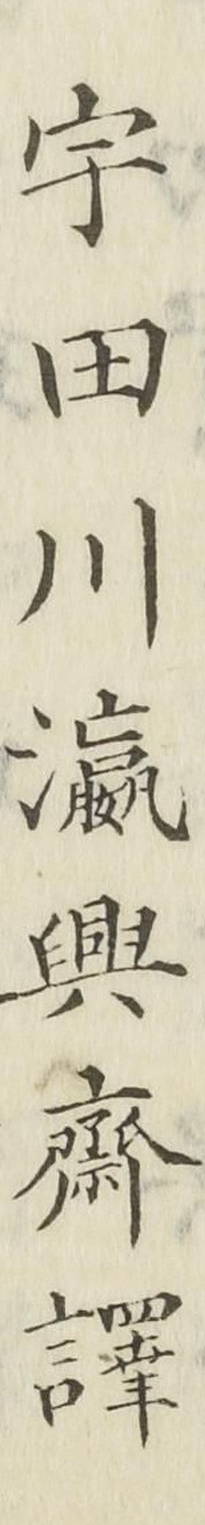宇田川瀛興齊譯
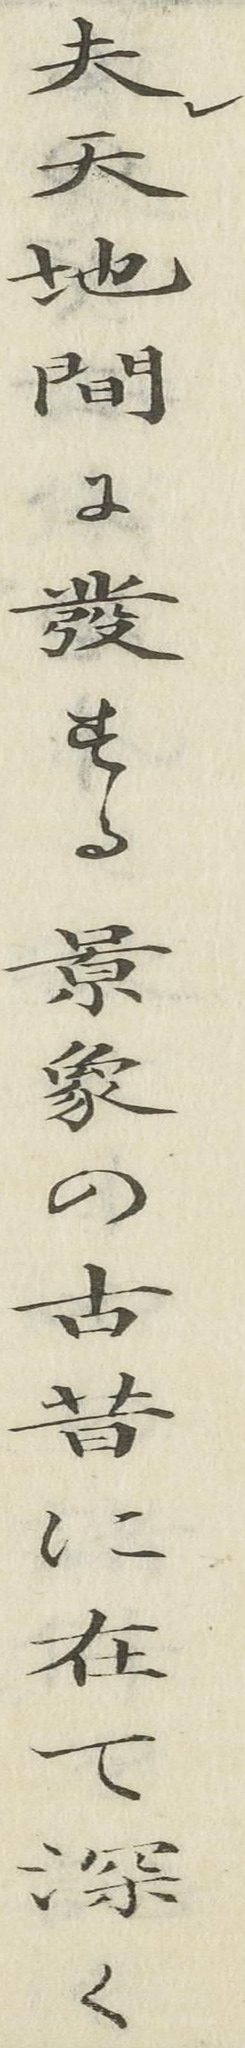夫天地間に発する景象の古昔に在て深く
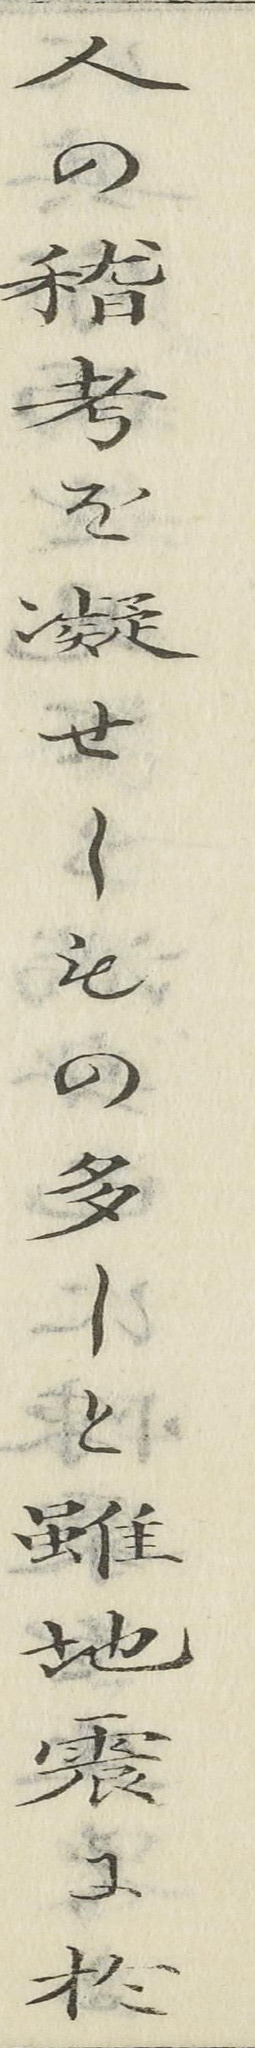人の稽考を凝せしもの多しと雖地震に於
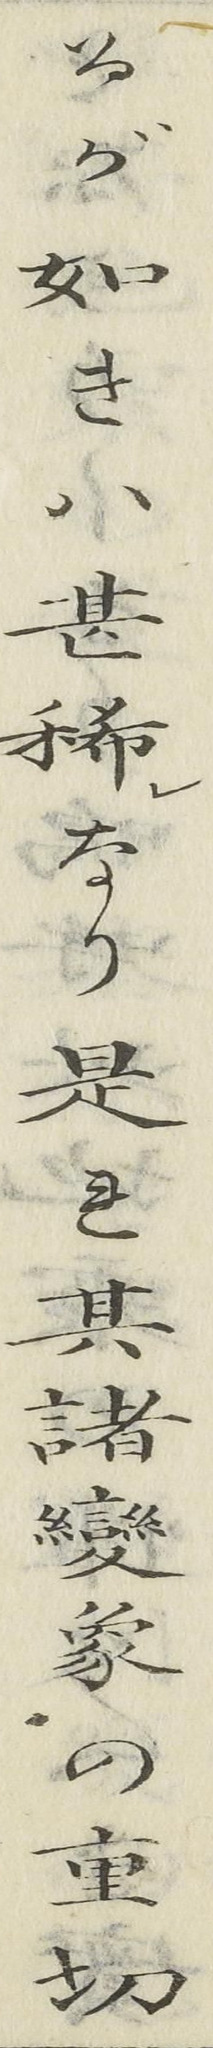るが如きは甚稀是れ其諸変象の重切
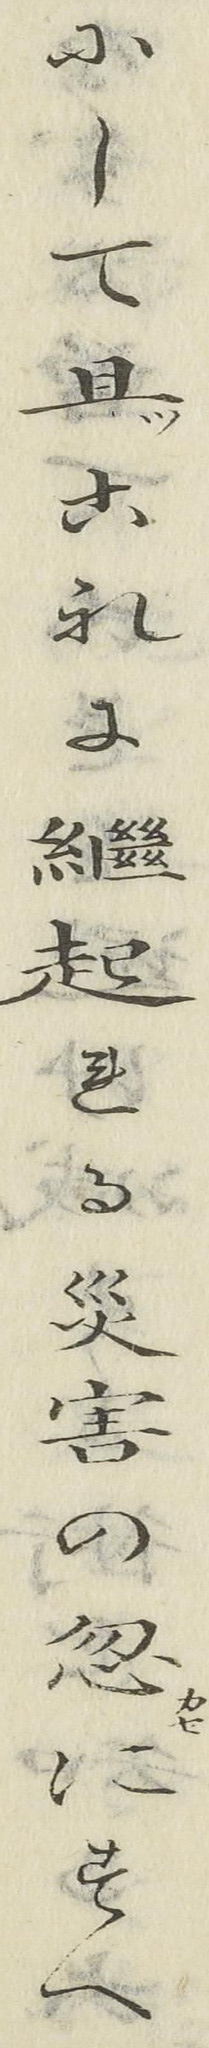にして且継起れる災害の忽
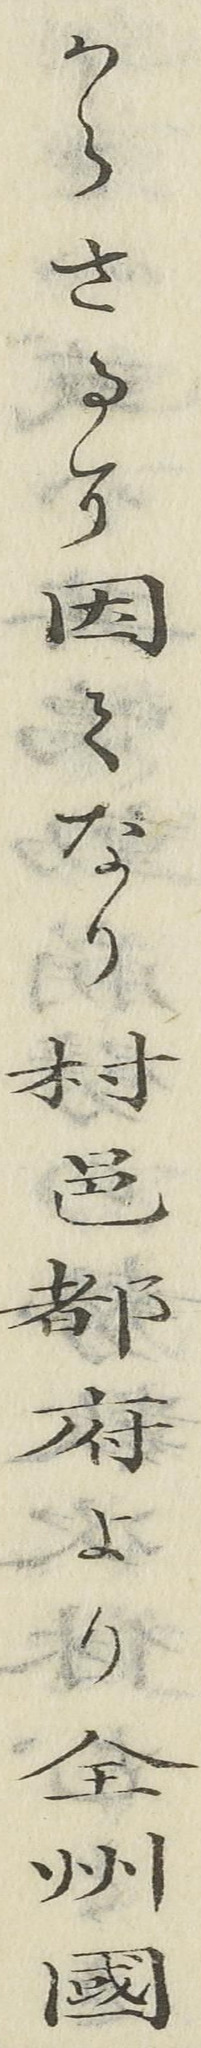からさるに因てなり村邑都府より全州国
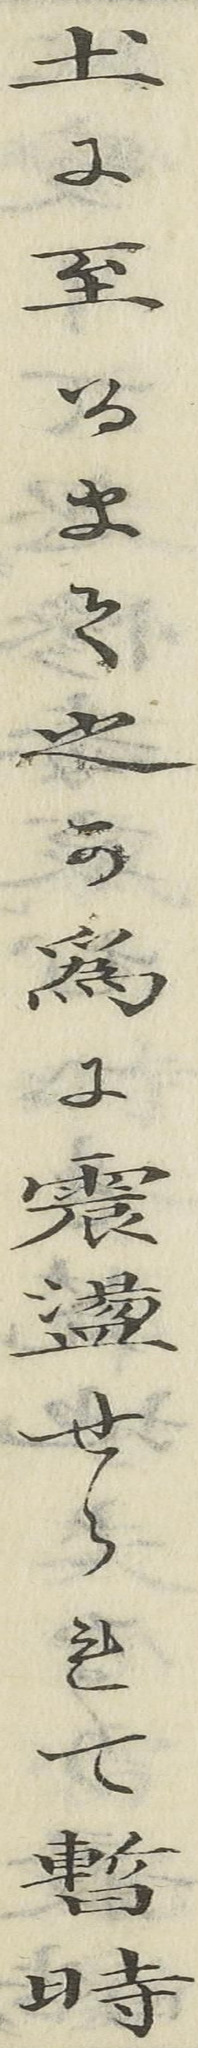土に至るまて之か為に震盪せられて暫時

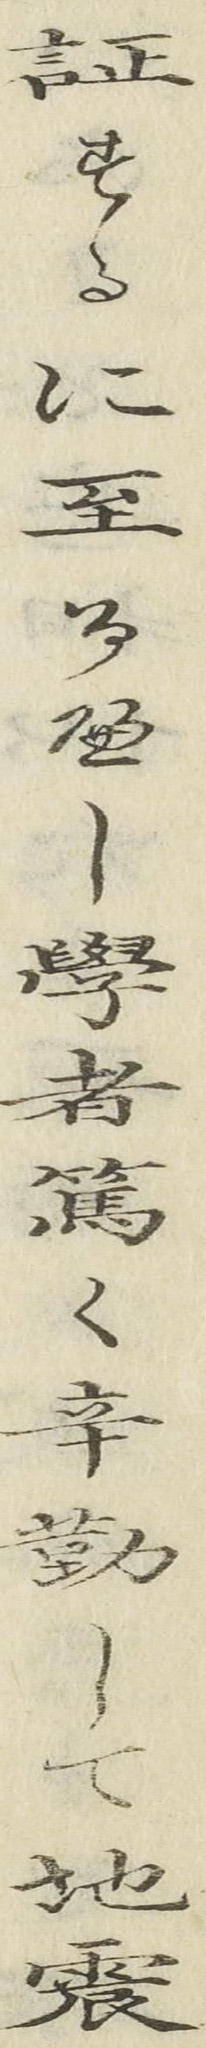証するに至るべし学者篤く辛勤して地震
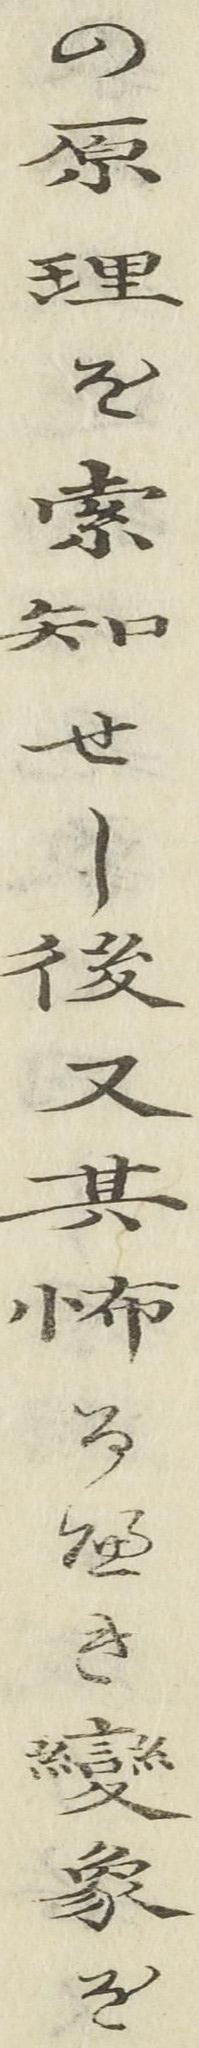の原理を索知せし後又其恐るべき変象を
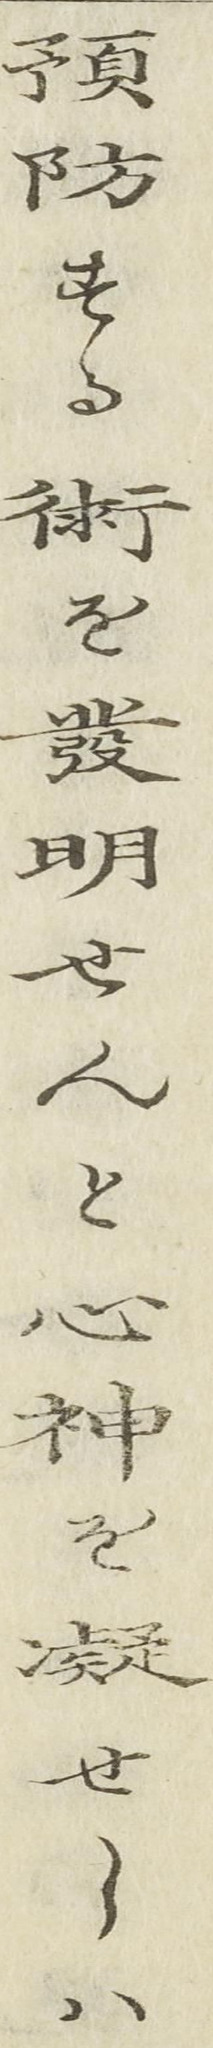預防する術を発明せんと心神を凝せしは
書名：地震預防説
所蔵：東京大学地震研究所図書室 Earthquake Research Institute Library, The University of Tokyo, JAPAN
